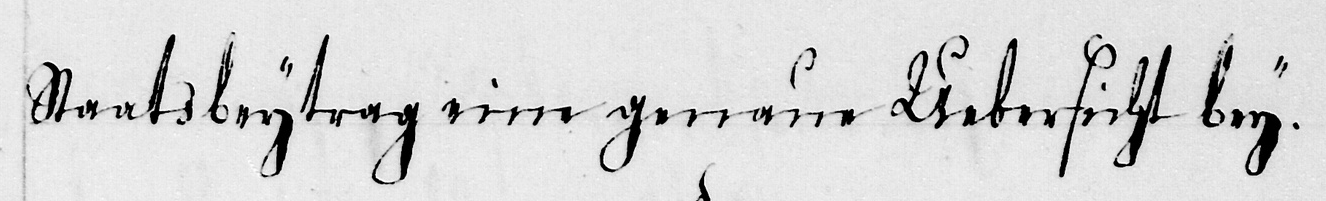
Staatsbeytrag eine genaue Uebersicht bey.
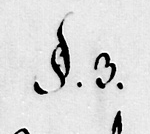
§. 5.
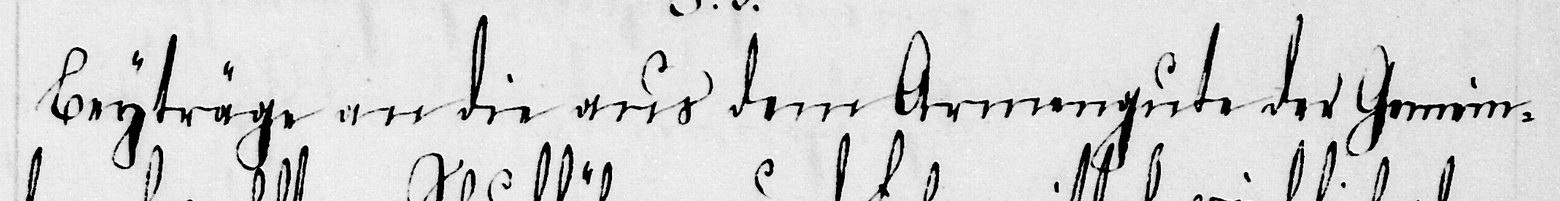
Beyträge an die aus dem Armengute der Gemein¬
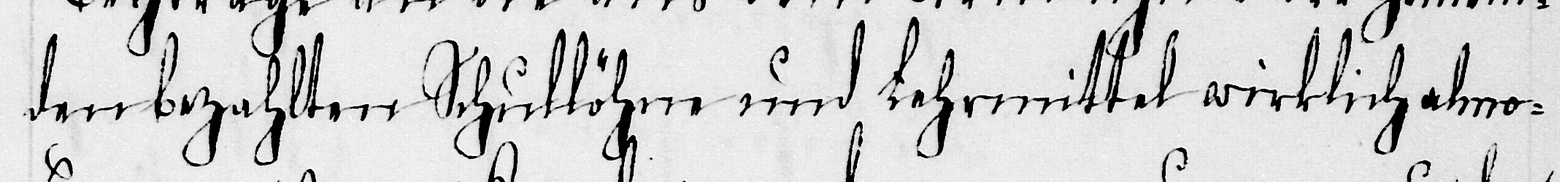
den bezahlten Schullöhne und Lehrmittel wirklich almo¬
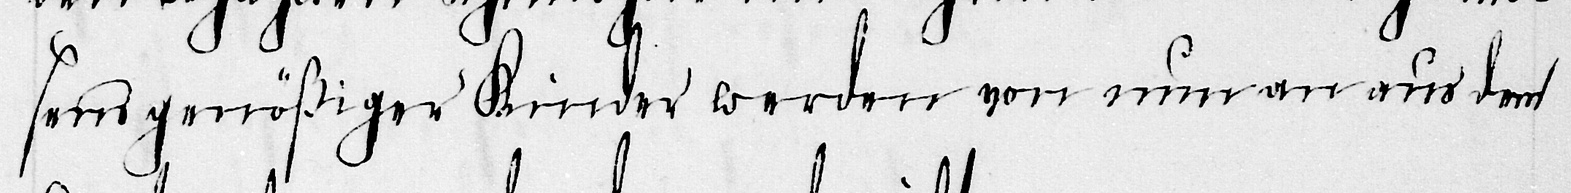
sensgenößiger Kinder werden von nun an aus dem
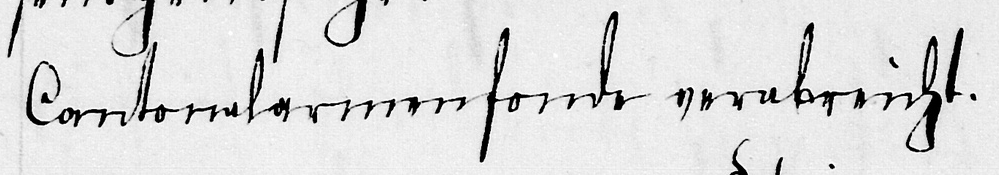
Cantonalarmenfonde verabreicht.
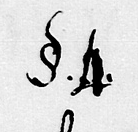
§. 4.
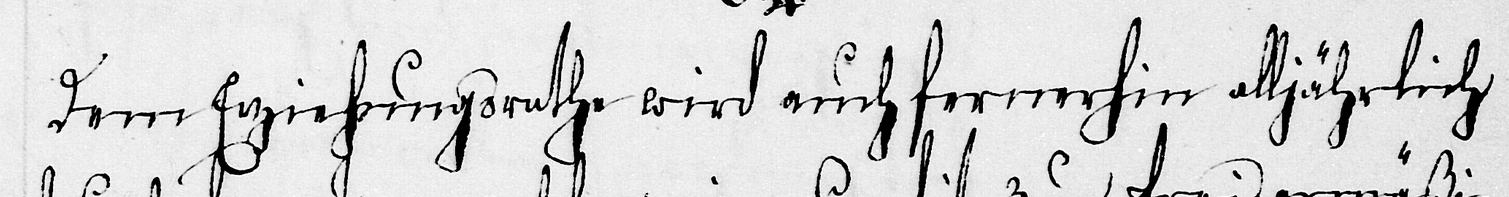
Dem Erziehungsrathe wird auch fernerhin alljährlich
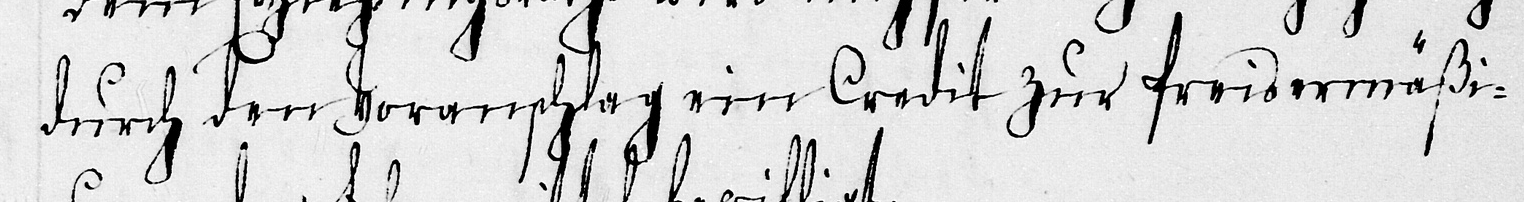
durch den Voranschlag ein Credit zur Preisermäßi¬
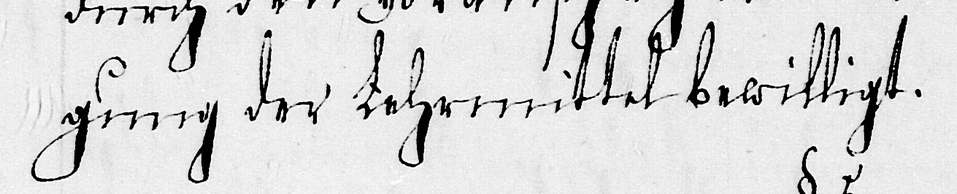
gung der Lehrmittel bewilligt.
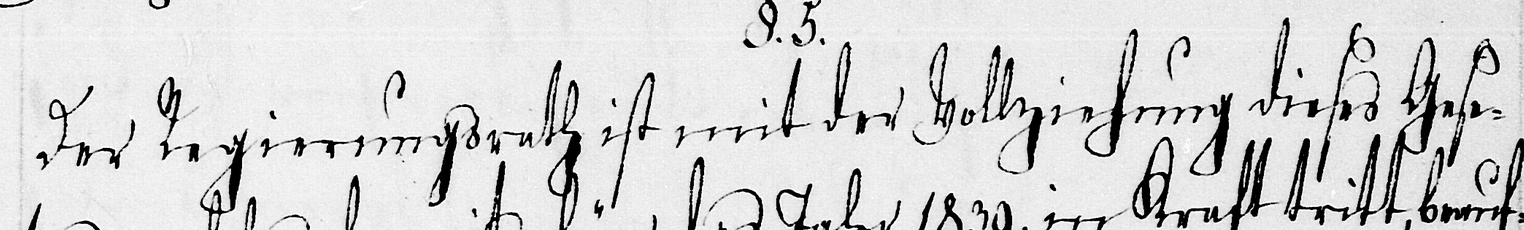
Der Regierungsrath ist mit der Vollziehung dieses Gese¬
